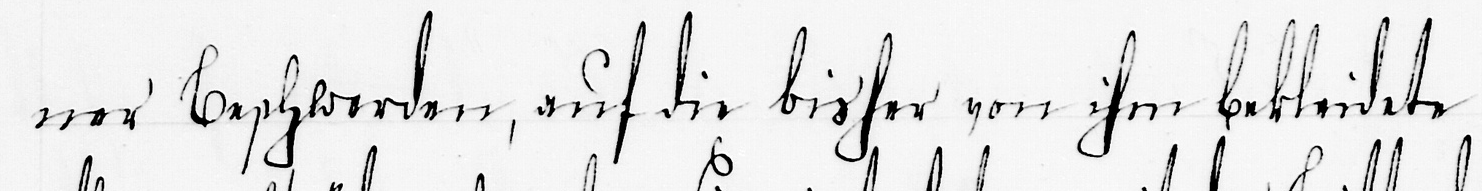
ner Beschwerden, auf die bisher von ihm bekleidete
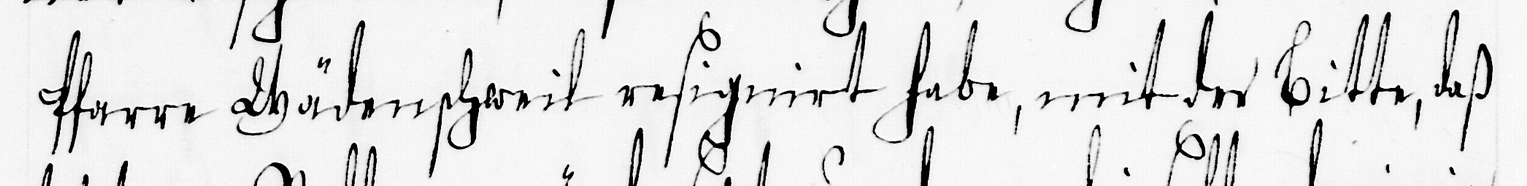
Pfarre Wädenschweil resigniert habe, mit der Bitte, daß
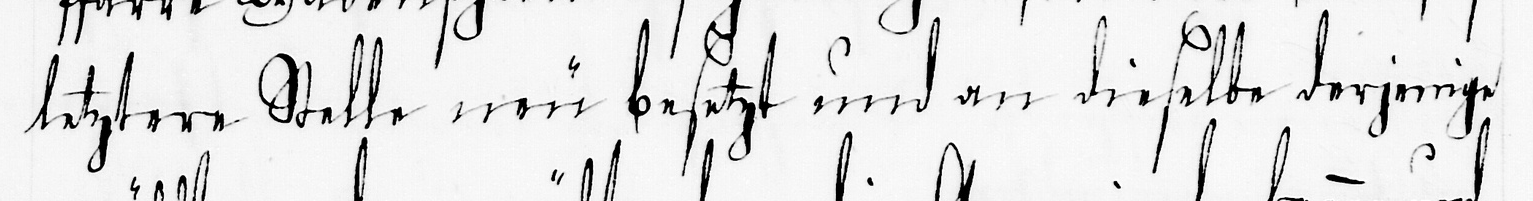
letztere Stelle neu besetzt und an dieselbe derjenige
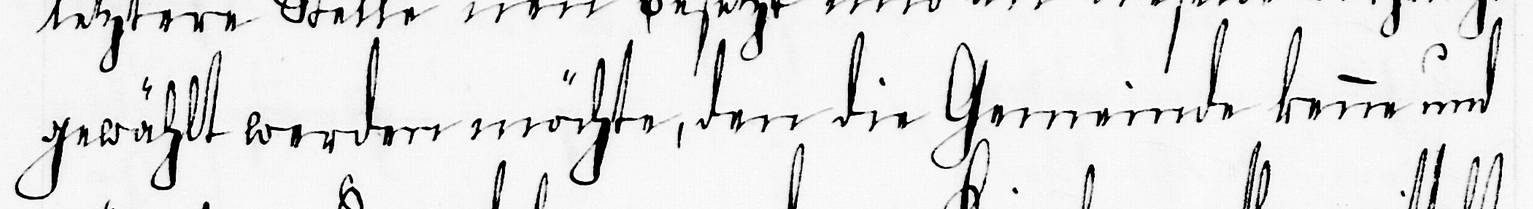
gewählt werden möchte, den die Gemeinde kenne und
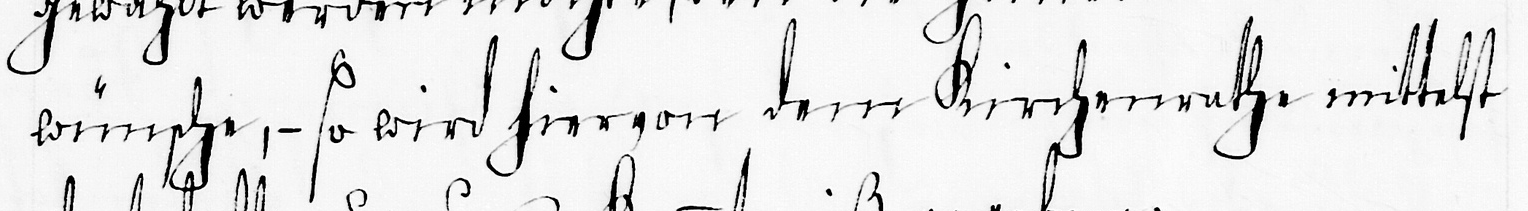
wünsche, – so wird hiervon dem Kirchenrathe mittelst
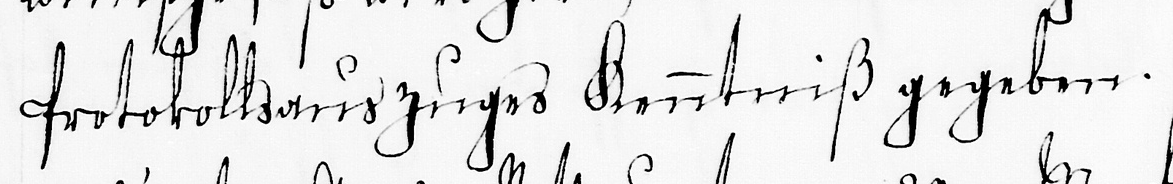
Protokollsauszuges Kenntniß gegeben.
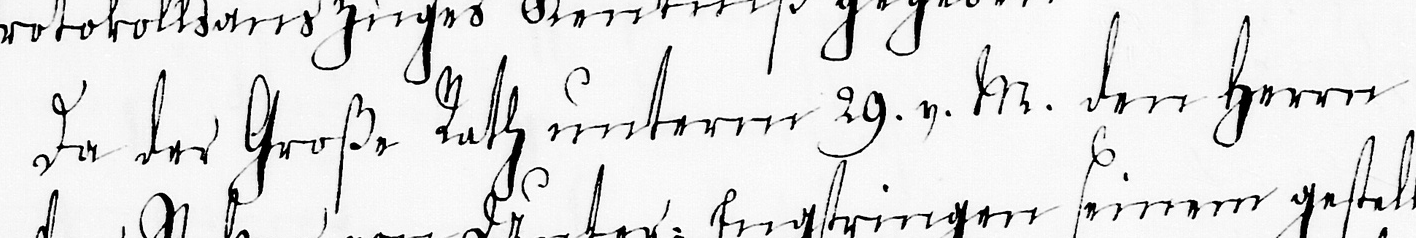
Da der Große Rath unterm 29. v. M. den Herrn
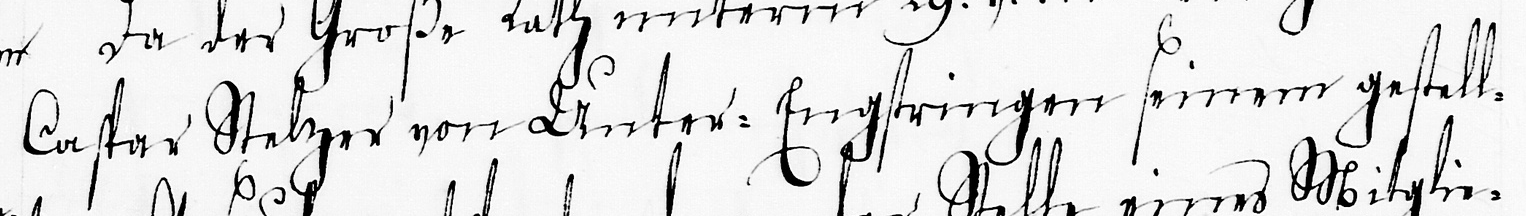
Caspar Stelzer von Unter-Engstringen seinem gestell¬
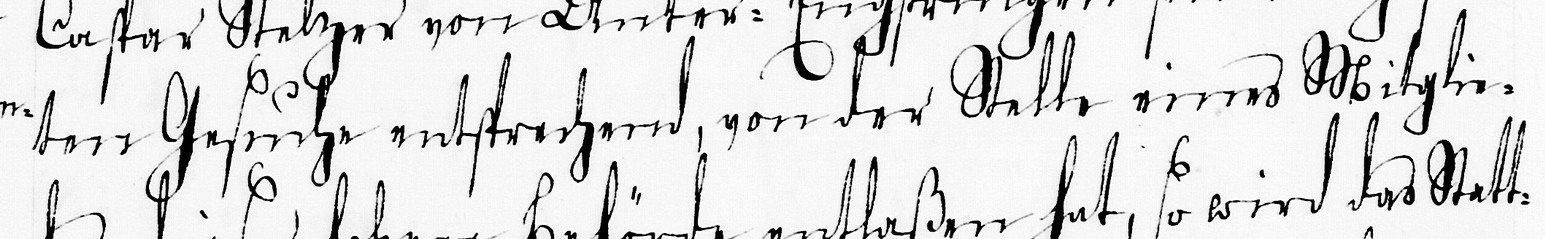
ten Gesuche entsprechend, von der Stelle eines Mitglie¬
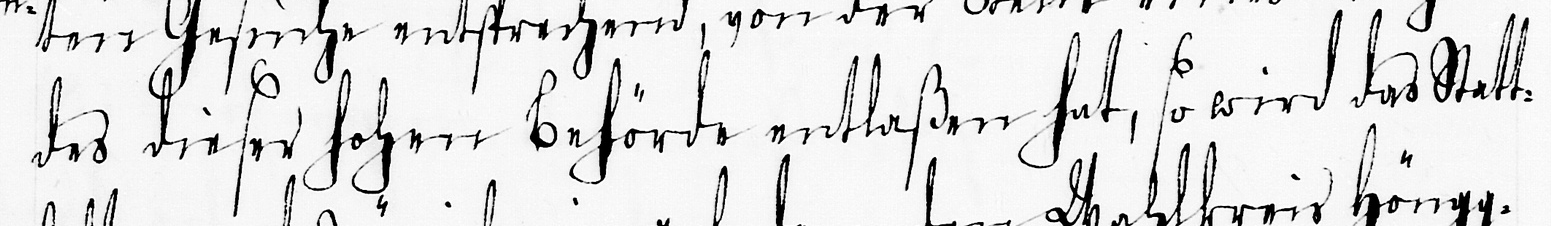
des dieser hohen Behörde entlaßen hat, so wird das Stat¬
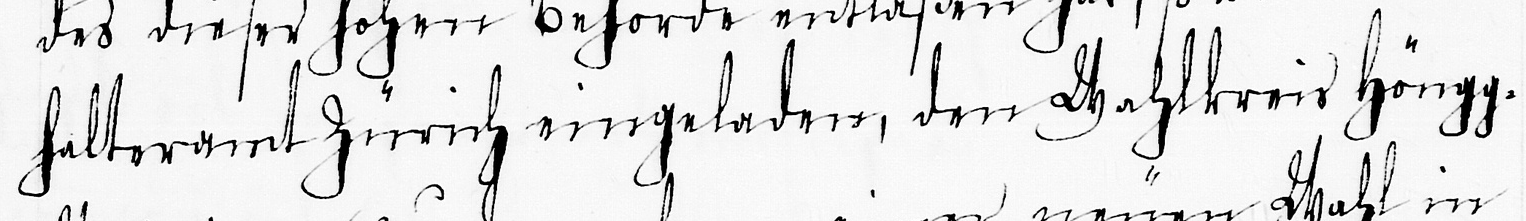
thalteramt Zürich eingeladen, den Wahlkreis Höng¬
